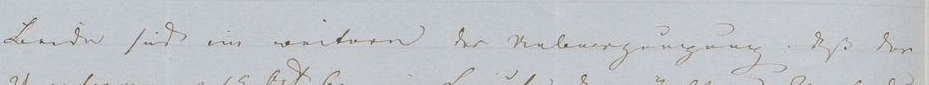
Beide sind im weitern der Ueberzeugung – daß der
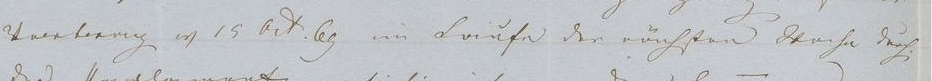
Vertrag vom 15 Oct. 69 im Laufe der nächsten Woche durch
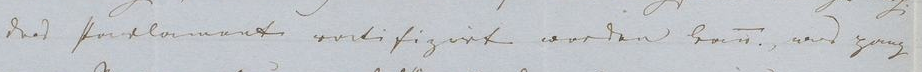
das Parlament ratifizirt werden kann, was ganz
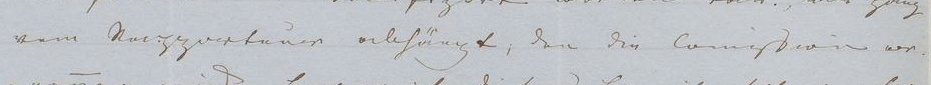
vom Rapporteur abhängt, den die Comission er-
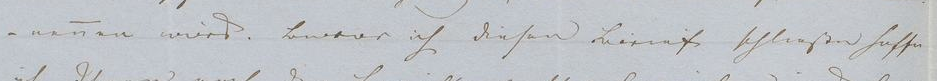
nennen wird. Bevor ich diesen Brief schließe hoffe
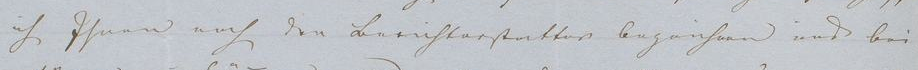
ich Ihnen noch den Berichterstatter bezeichnen und bei-
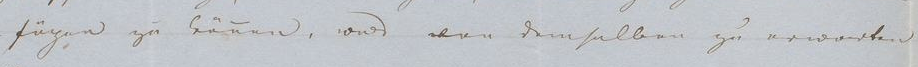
fügen zu können, was von demselben zu erwarten
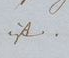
ist.
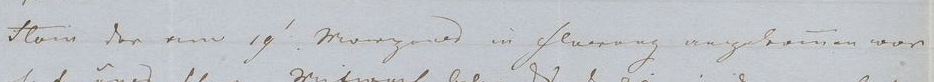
Stamm der am 19t Morgens in Florenz angekommen war
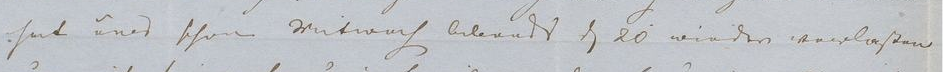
hat uns schon Mitwoch Abends des 20t wieder verlaßen
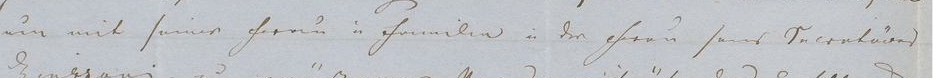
um mit seiner Frau u Familie u der Frau seines Secretärs
